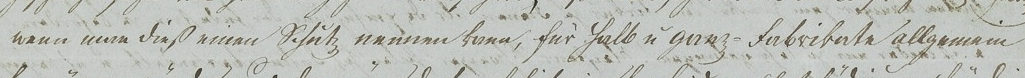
wenn man dieß einen Schutz nennen kann, für Halb u ganz-Fabrikate allgemein
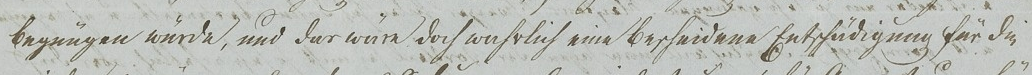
begnügen würde, und das wäre doch wahrlich eine bescheidene Entschädigung für die
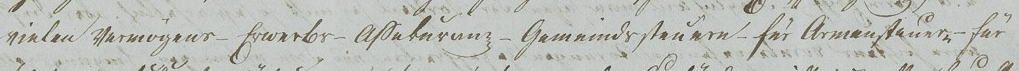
vielen Vermögens- Erwerbs- Assekuranz- Gemeindssteuern – für Armensteuern – für
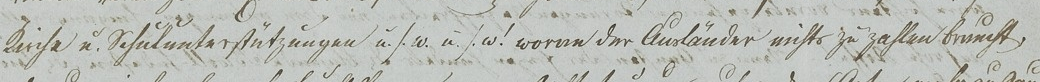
Kirche u. Schulunterstützungen u. s. w. u. s. w! woran der Ausländer nichts zu zahlen braucht,
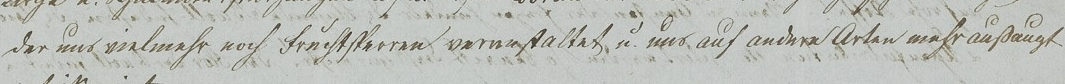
der uns vielmehr noch Fruchtsperren veranstaltet u. uns auf andere Arten mehr aussaugt
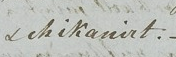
& chikanirt. –
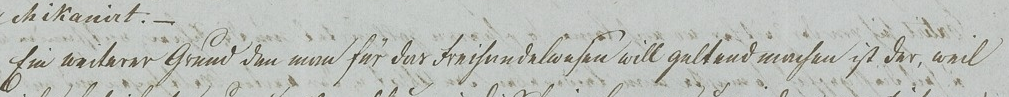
Ein weiterer Grund den man für das Freihandelwesen will geltend machen ist der, weil
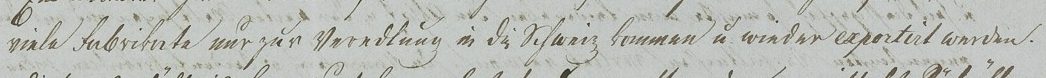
viele Fabrikate nur zur Veredlung in die Schweiz kommen u. wieder exportirt werden.
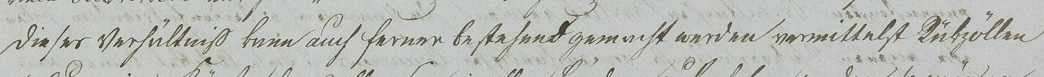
Dieses Verhältniß kann auch ferner bestehend gemacht werden vermittelst Rükzöllen
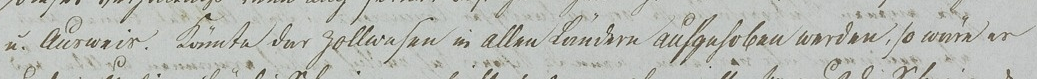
u. Ausweis. Könnte das Zollwesen in allen Ländern aufgehoben werden, so wäre es
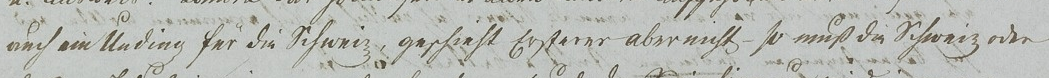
auch ein Unding für die Schweiz, geschieht Ersteres aber nicht – so muß die Schweiz oder
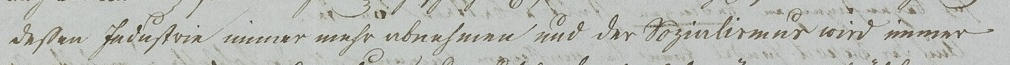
dessen Industrie immer mehr abnehmen und der Sozialismus wird immer
